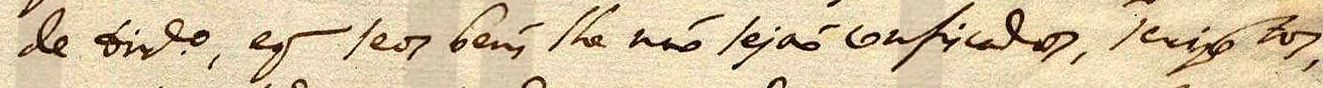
de Dir.to, e q̄ seos bens̄ lhe naõ sejaõ confiscados, scriptos,
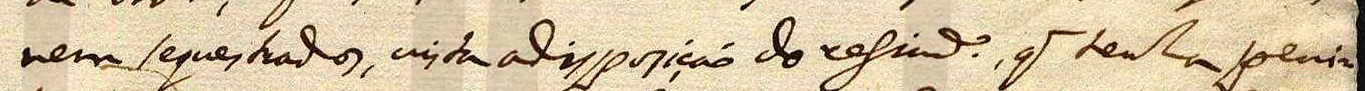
nem sequestrados, uista a dispoziçaõ do regim.to, q̄ tenha peni
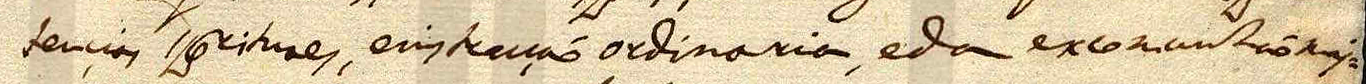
tencias sprituaes, e instruçaõ ordinaria, e da excomunhaõ may
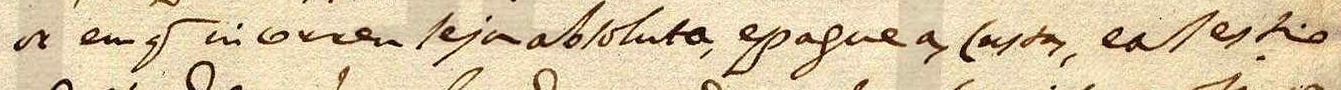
or em q̄ incorreu seja absoluta, e pague as Custas, e asestio
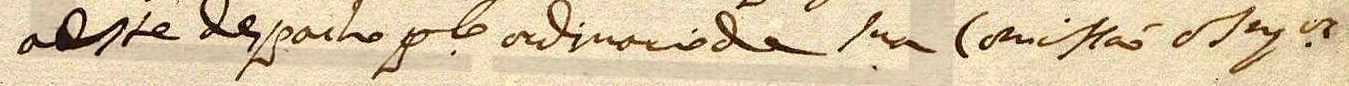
a este despacho p.lo ordinario de sua Comissaõ o Inq.or
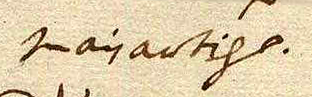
mais antigo.
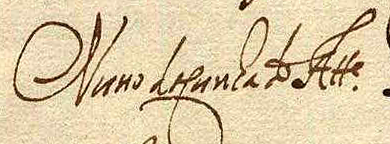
Nuno da Cunha d̄ Att.e
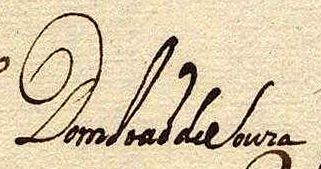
Dom Ioaõ de Souza
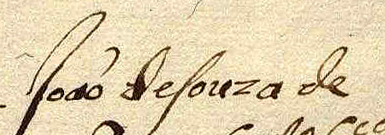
Joaõ de Souza de
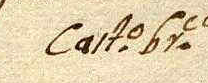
Cast.o br.co
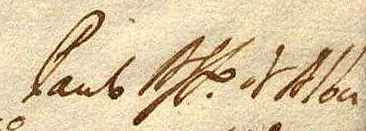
Paulo Aff.o de Albu
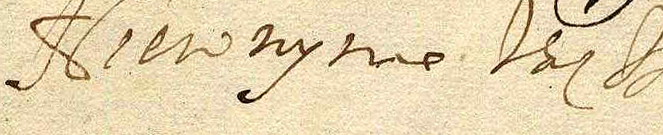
Hieronymo Vas
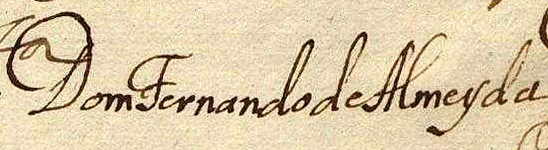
Dom Fernando de Almeyda
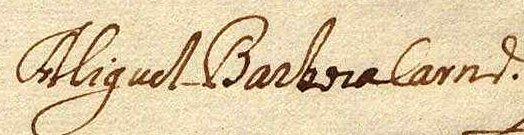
Miguel Barboza Carnr.o
